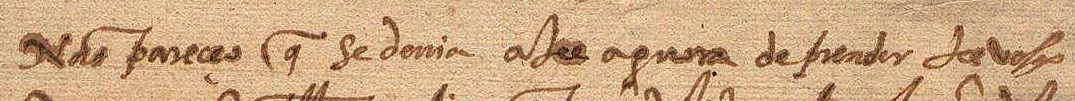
Naõ pareceo q̄ se deuia atee aguora de prender tee vosas
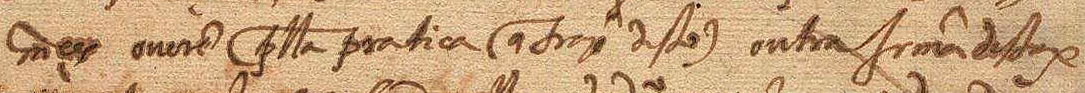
m̄ces o uerē p̄lla pratica q̄ trazē disto outra Jrmā destas
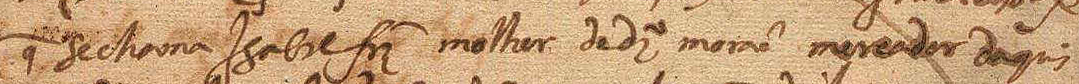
q̄ se chama Jsabel frz̄ molher de djo moraõ mercador daqui
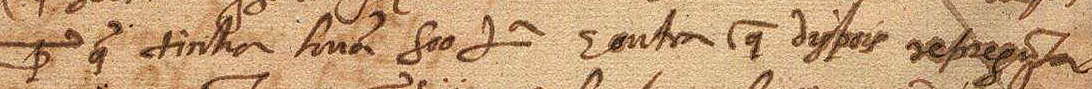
p̄oq̄ tinha huā soo ta E outra q̄ dispois repregūta
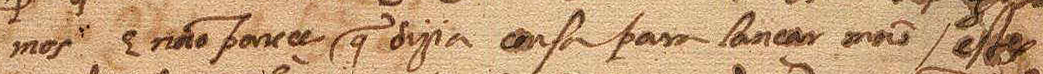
mos E naõ parece q̄ dizia cousa para lançar maõ / estes
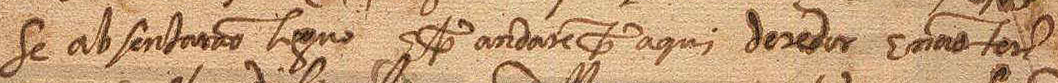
se absentaraõ loguo E p̄o andarē p̄o aqui deredor E não terē
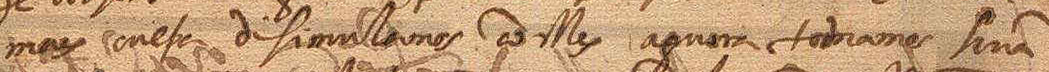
mais culpa disimulamos cō elles aguora tomamos huā
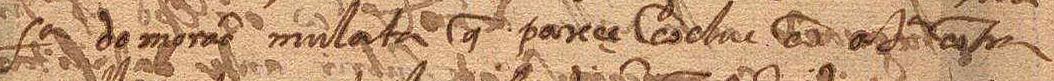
fa do moraõ mulata q̄ parece cōclue c̄o a ta cōtra
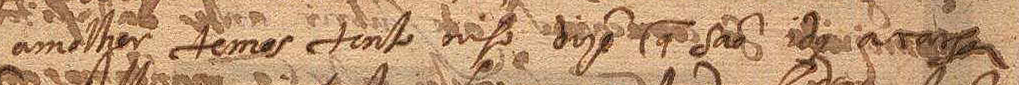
a molher temos tento niso dizē q̄ saõ idꝯ a carsa
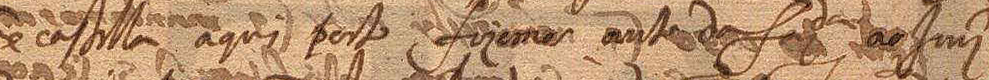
ē castella aqui perto fizemos auto do fazda ao Juiz̄
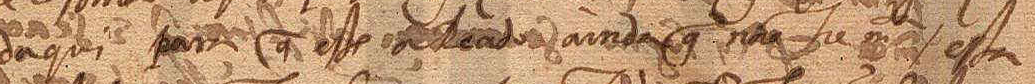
daqui para q̄ este a Recado ainda q̄ naõ he mta / esta
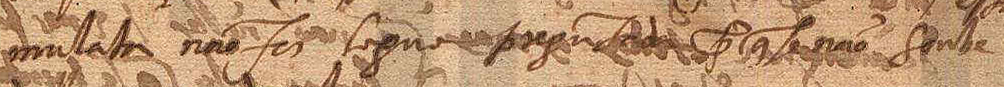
mulata naõ foi loguo pregūtada p̄oq̄ se naõ soube
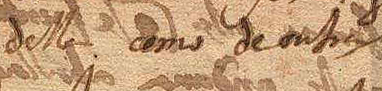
della como de outras
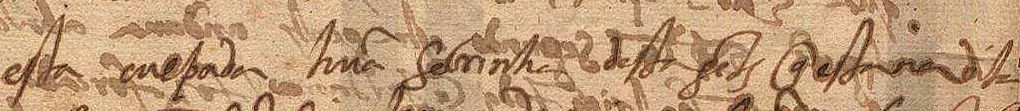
esta culpada huā sobrinha desta gētꝭ q̄ esta na dita
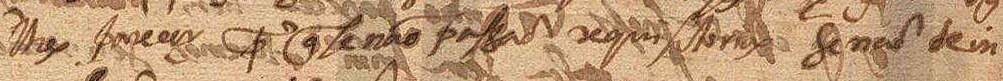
lhes parecer p̄oq̄ se naõ passaõ requisitorias se naõ de in
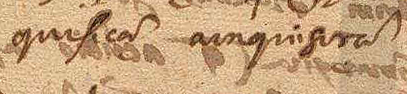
quisiçaõ a inquisiçaõ
